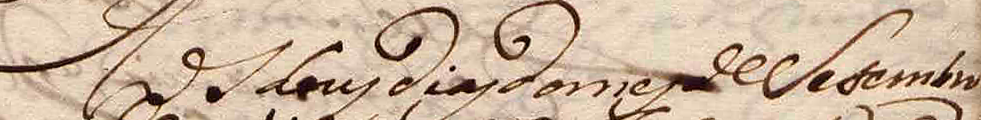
Aos dous dias do mes de Setembro
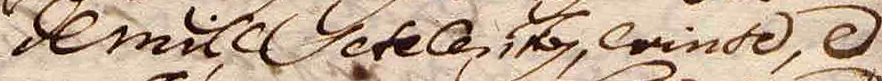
de mil, e SeteCentos, e vinte, e
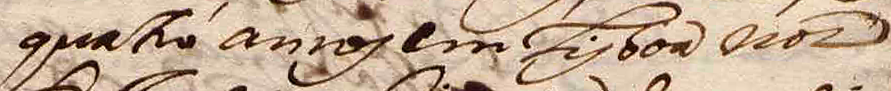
quatro annos em Lisboa noz
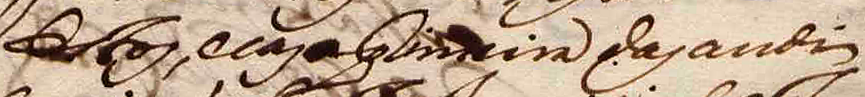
estaos, e caza pRimeira das audi
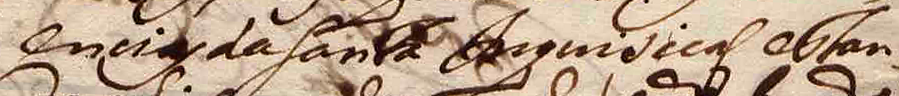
encias da santa Inquisiçaõ estan
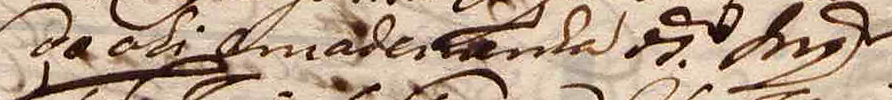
do ahi em a de manha o s.or Inqor
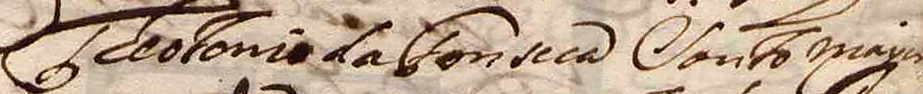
Theotonio da Fonseca Souto mayor
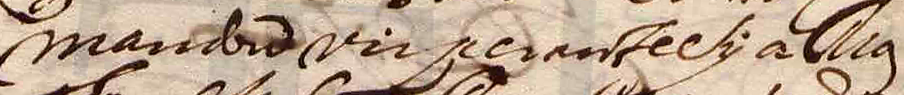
mandou vir perante sy a Ma
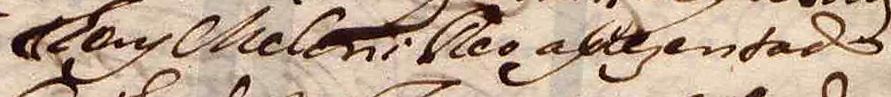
theus Meloni Reo apRezentado
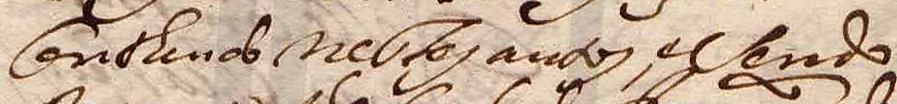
Contheudo nestes autos, e Sendo
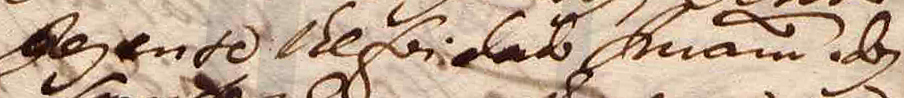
pRezente lhe foi dado Iuramto. dos
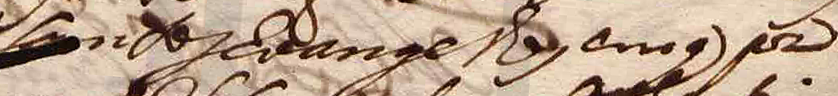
santos Evangelhos em q̄ poz
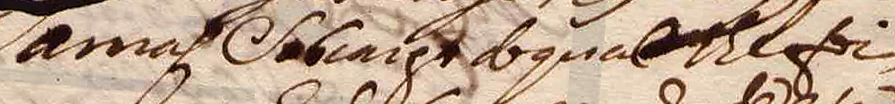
a maõ Sob cargo do qual lhe foi
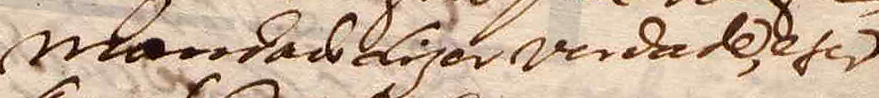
mandado dizer verdade, e ter
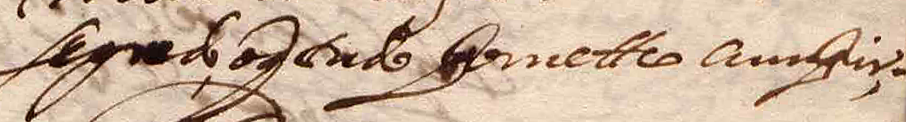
segredo, o q̄ tudo prometteo cumpRir,
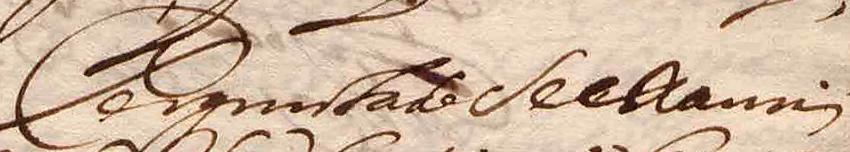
Perguntado se exami
